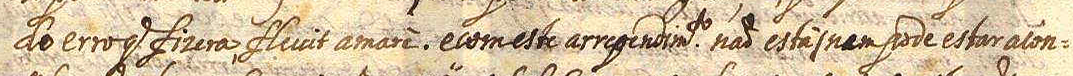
do erro q̄ fizera fleuit amarè. e com este arrependim.to naõ está (nam pode estar a con
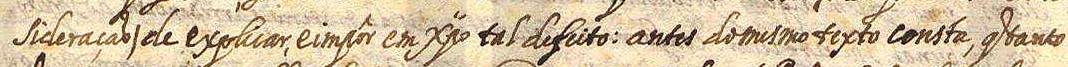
sideraçaõ) de explicar, e impôr em xp̄o tal defeito: antes do mesmo texto consta, q̄ tanto
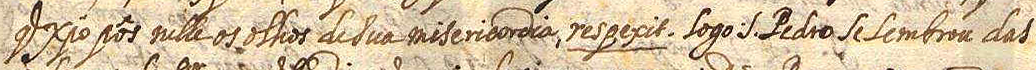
q̄ xp̄o pôs nelle os olhos de sua misericordia, respexit. logo S. Pedro se lembrou das
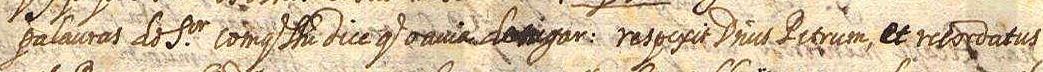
palauras do S.or com q̄ lhe dice q̄ o auia de sugar: respexit Dn̄us Petrum, et recordatus
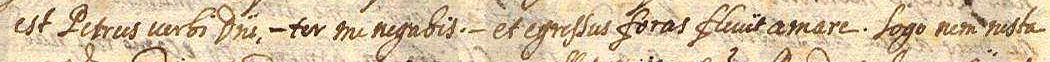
est Petrus uerbi Dn̄s, - ter me negabis. = et egressus foras fleuit amare. Logo nem nesta
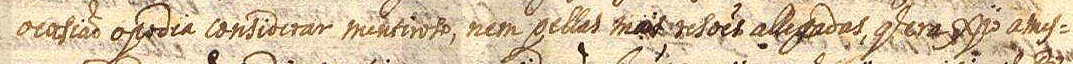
ocasiaõ o podia considerar mentiroso, nem pellas mais, resoẽs allegadas, q̄ era xpō a mes
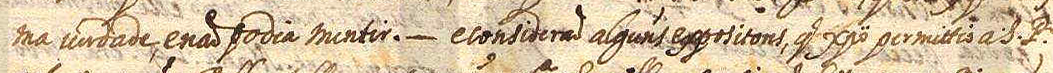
ma uerdade, e naõ podia mentir. - e consideraõ alguns expositores, q̄ xpō permittio a S. P.o
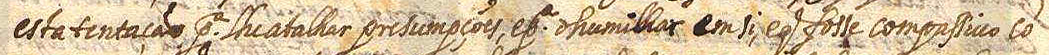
esta tentação p.a lhe atalhar presumpções, e p.a o humilhar em si, e q̄ fosse compassiuo cō
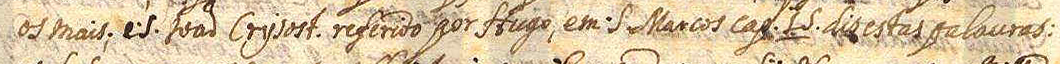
os mais; e s. Ioaõ Crysost. referido por Hugo, em S Marcos cap. 15. dis estas palauras:
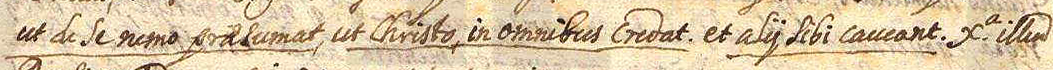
ut de se nemo præsumat, ut Christo in omnibus credat. et alij sibi caueant. x.a illud
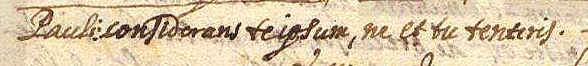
Paulus: considerans te ipsum, ne et tu tenteris.
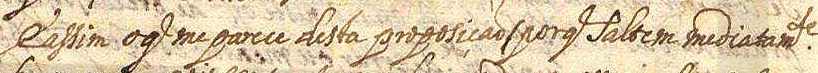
E assim o q̄ me parece desta proposiçaõ (porq̄ saltem mediatam.te
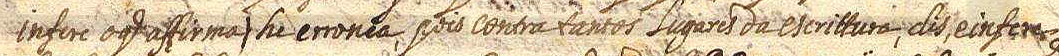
infere o q̄ affirma) he erronea, pois contra tantos Lugares da escrittura, dis, e infere
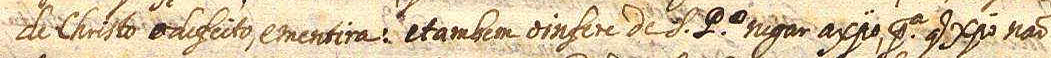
de Christo o defeito, e mentira: e tambem o infere de S. P.o negar a xp̄o, p.a q̄ xpō naõ
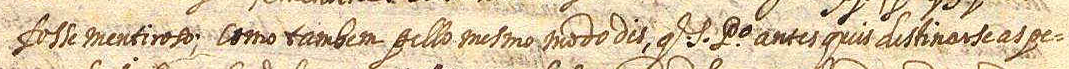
fosse mentiroso; como tambem pello mesmo modo dis, q̄. S. P.o antes quis destinarse as pe
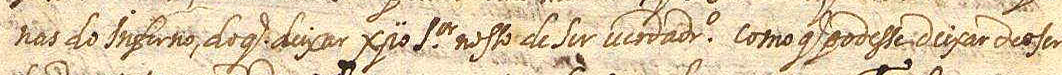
nas do Inferno, do q̄ deixar xp̄o S.or nosso de ser uerdadr.o como q̄ podesse deixar de o ser
